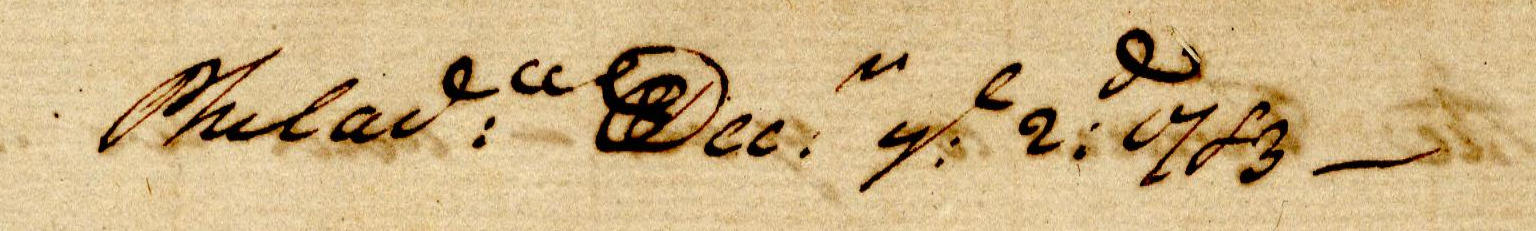Philad^a Dec^r. y^e. 2^d: 1783
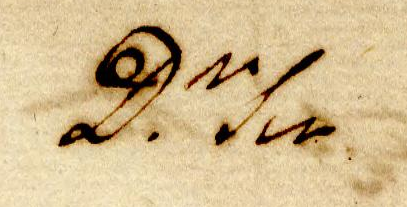D^r. Sir
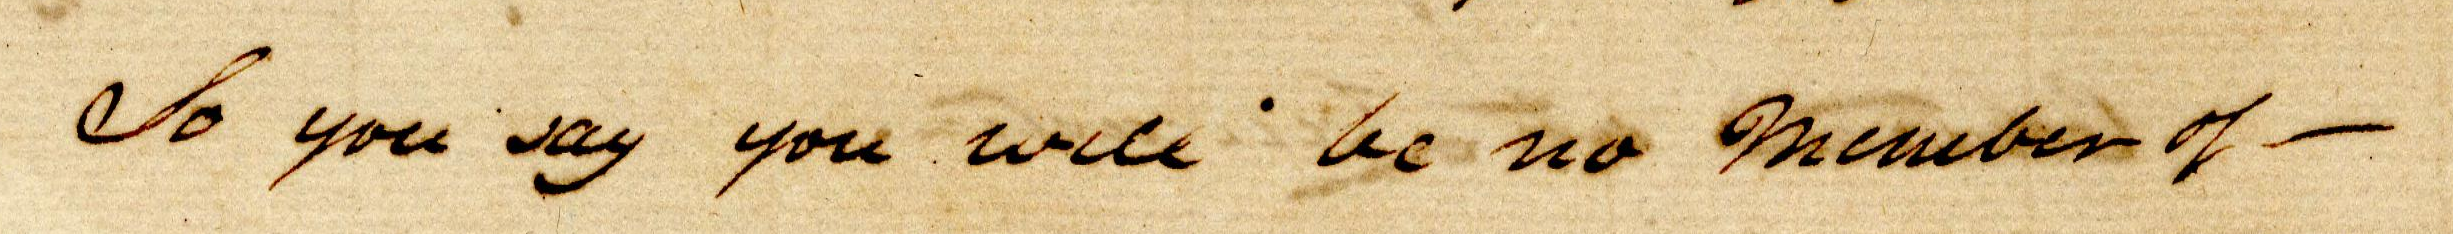So you say you will be no member of
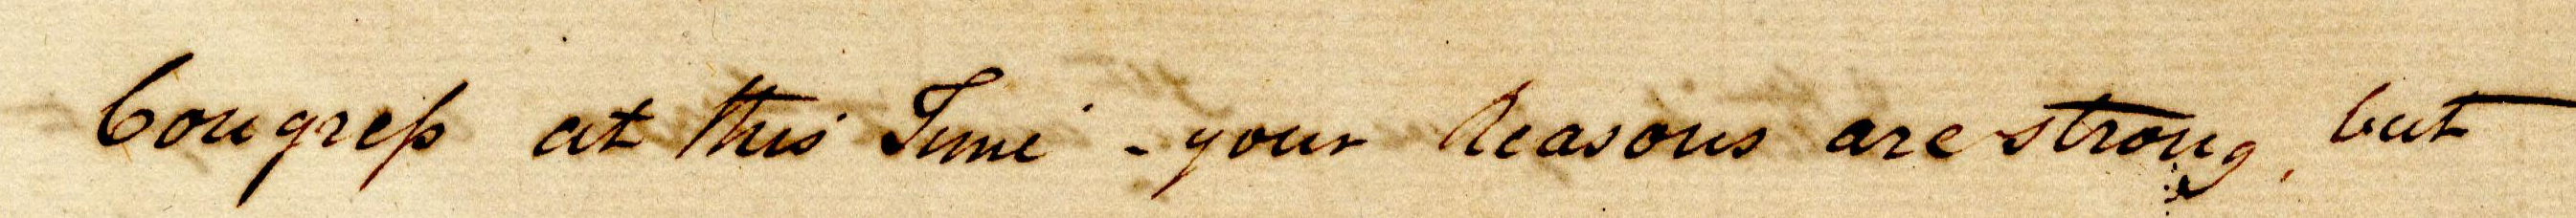Congress at this Tune. your reasons are strong, but
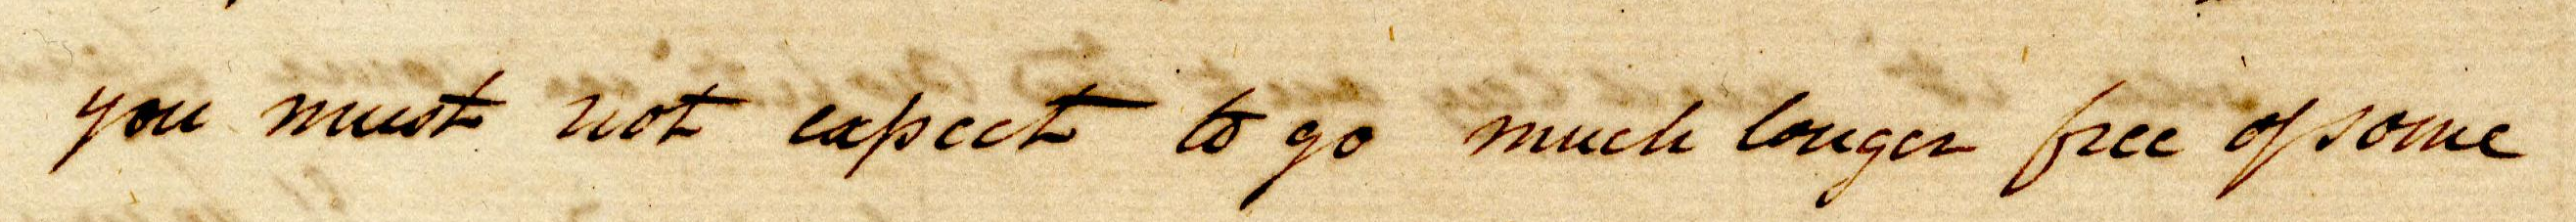you must not expect to go much longer free of some
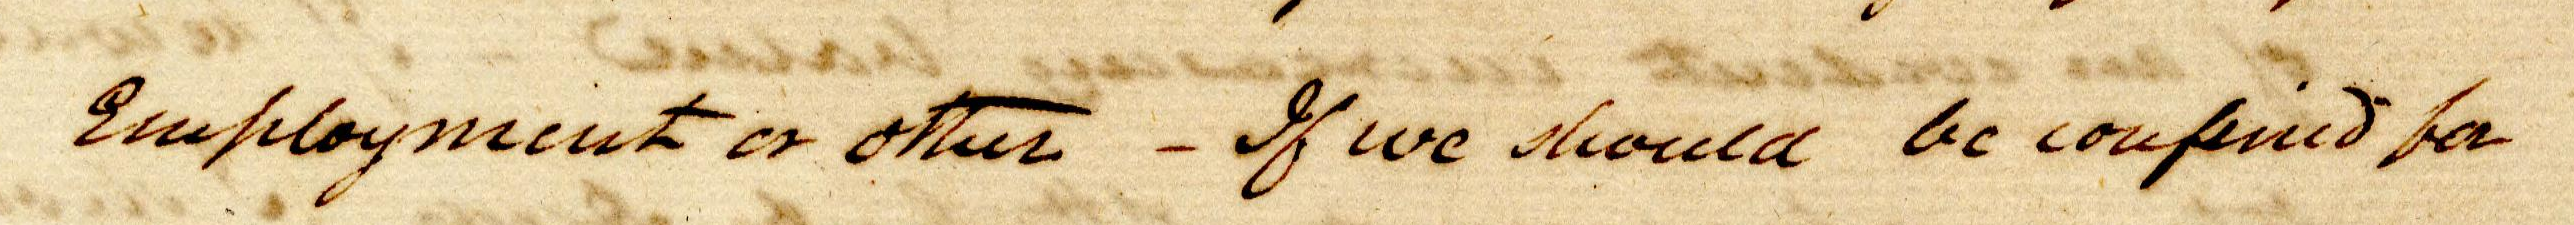Employment or other. If we should be confined for
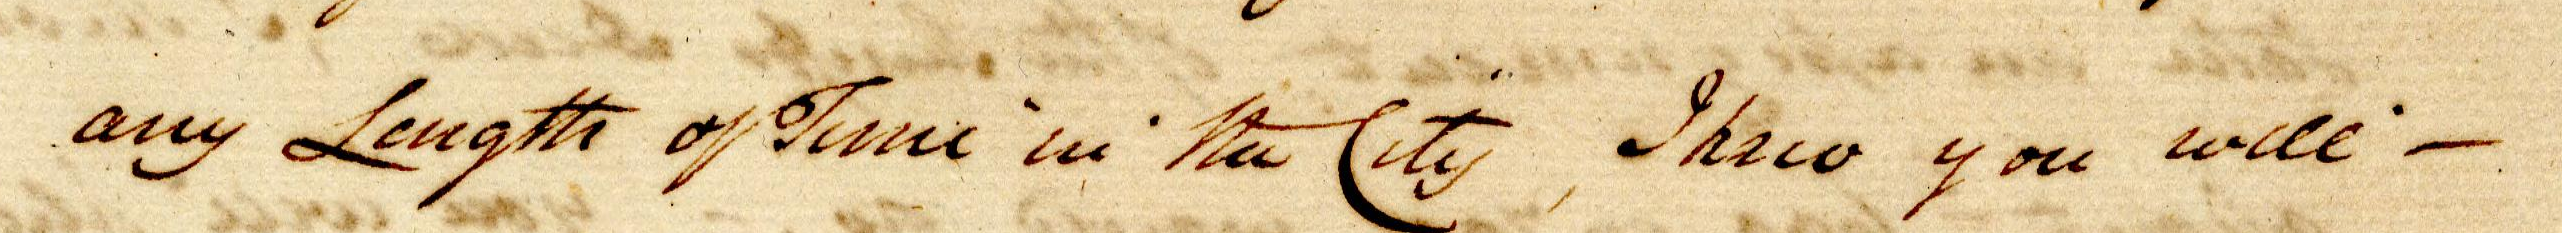any Length of Time in the City Show you will
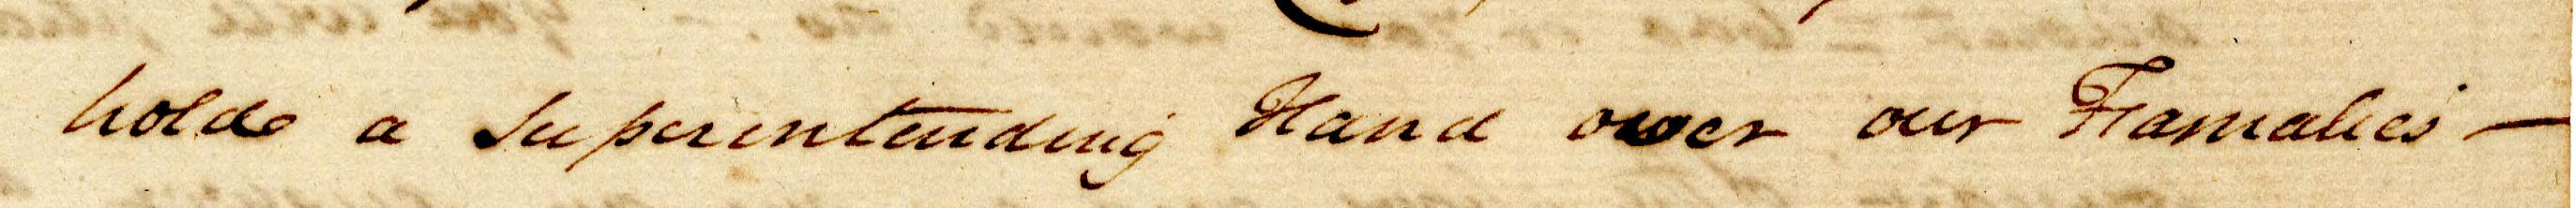hold a Superintending Hand over our Famalies
